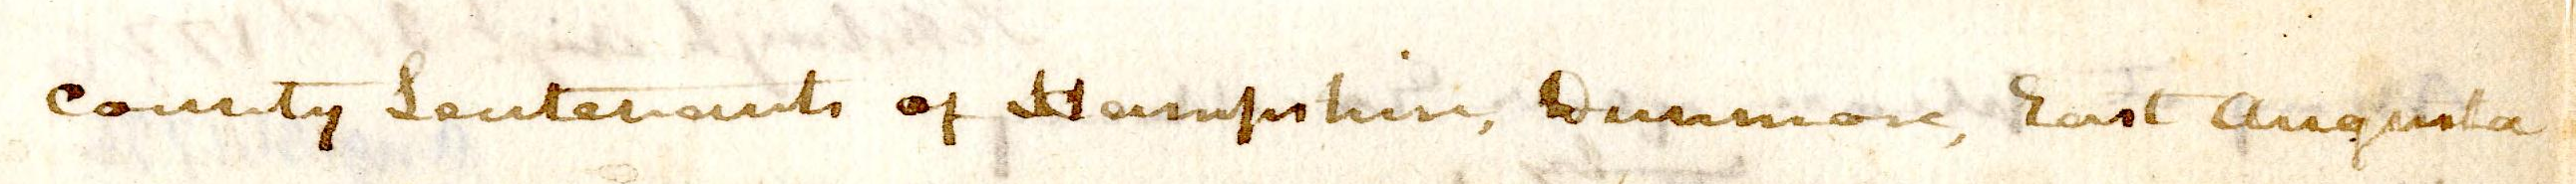county Leutenants of Hampshire, Dunmore, East Augusta
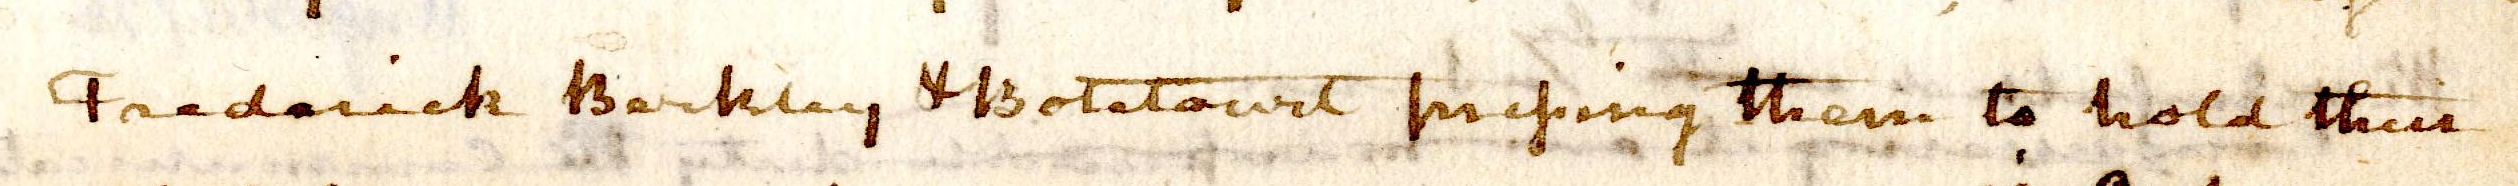Frederick Barkley & Botatourt pressing them to hold their
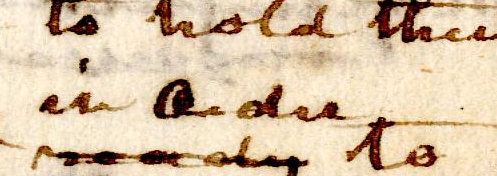in Order
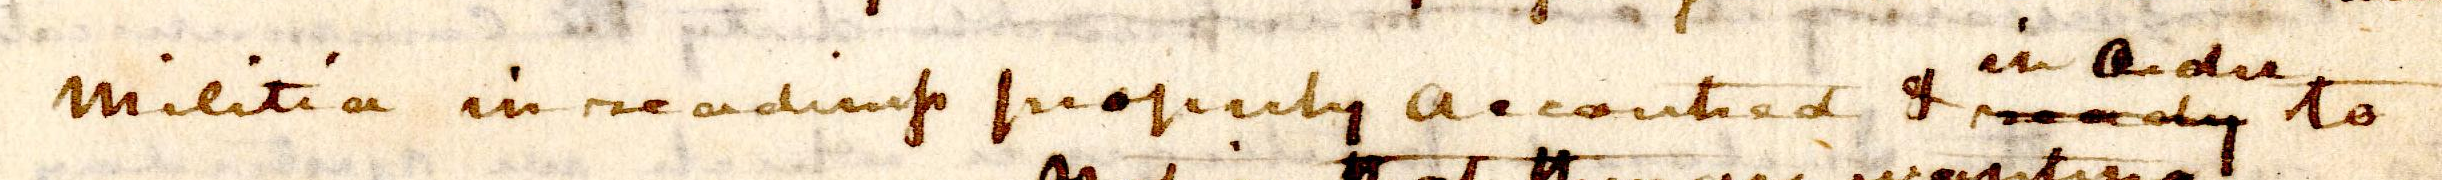Militia in readiness properly accoutred & [ready] to
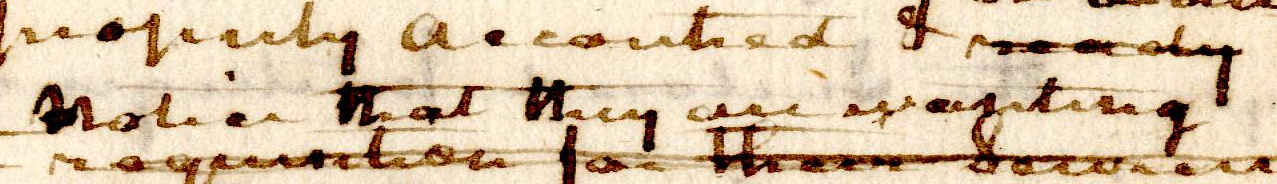notice that they are wanting
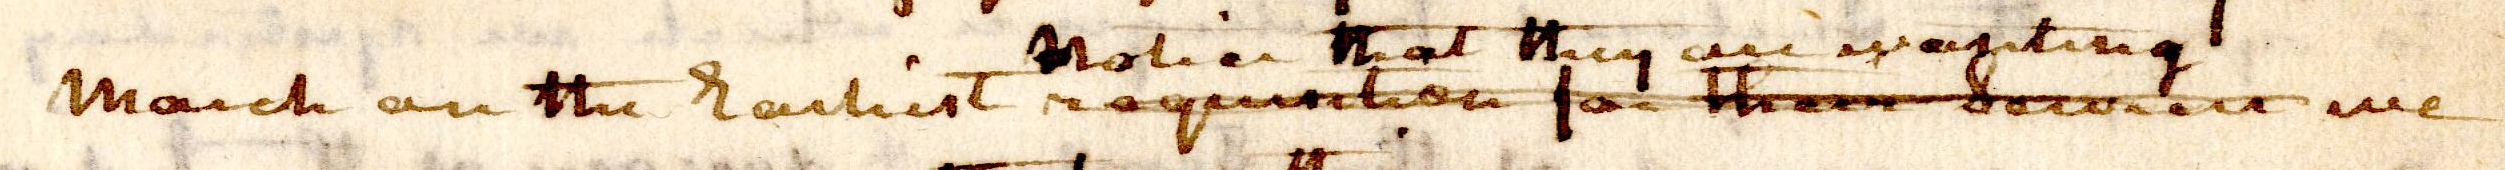March on the Earliest [negotiation for their Service] we
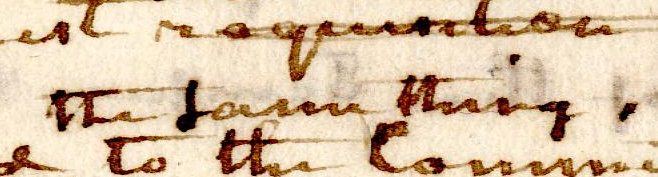the same thing
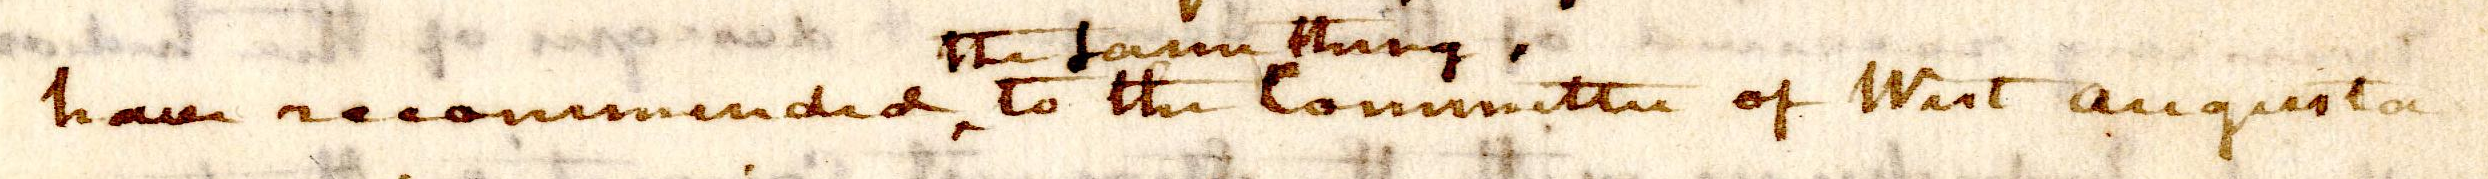have recommended ^ to the Committee of West Augusta
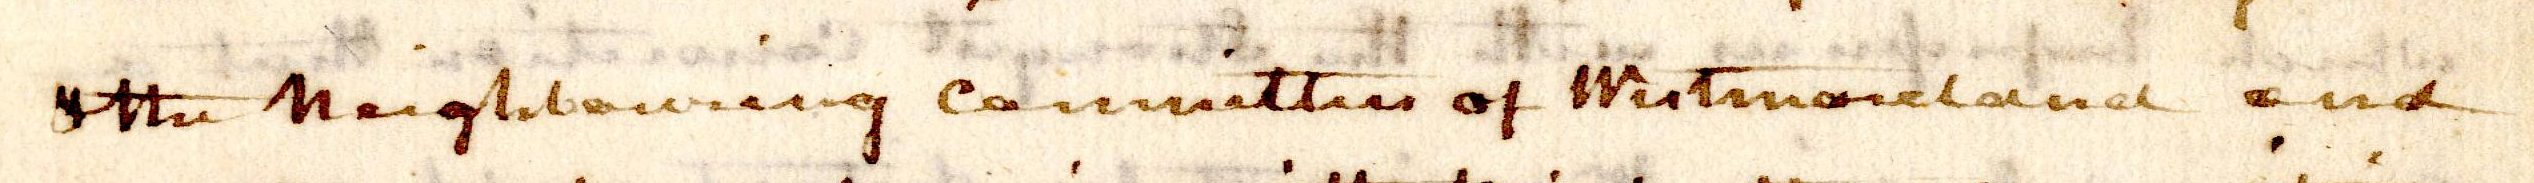& the Neighbouring Committees of Westmoreland and
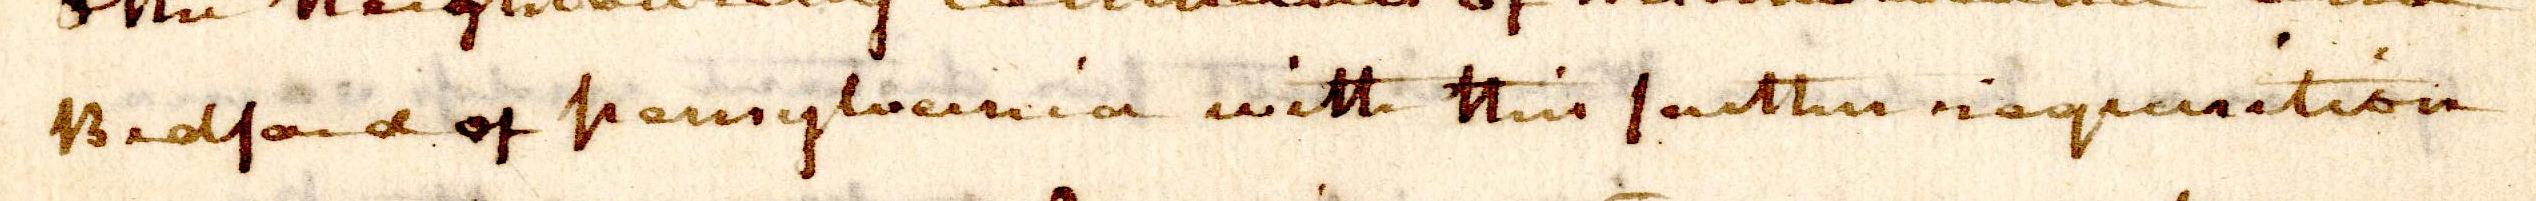Bedford of Pennsylvania with their further negotiation
